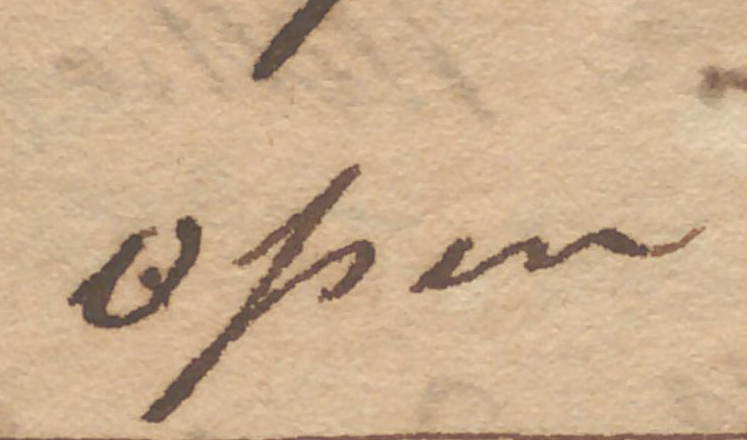open
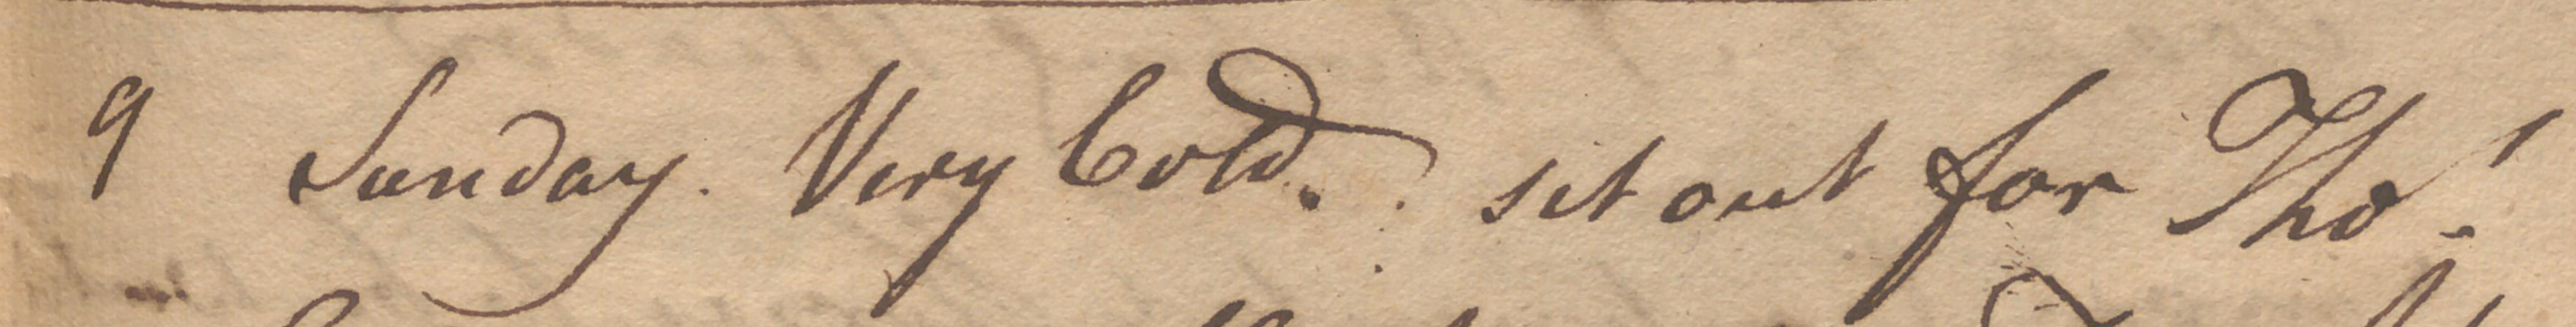9 Sunday. Very Cold. set out for Tho^s.
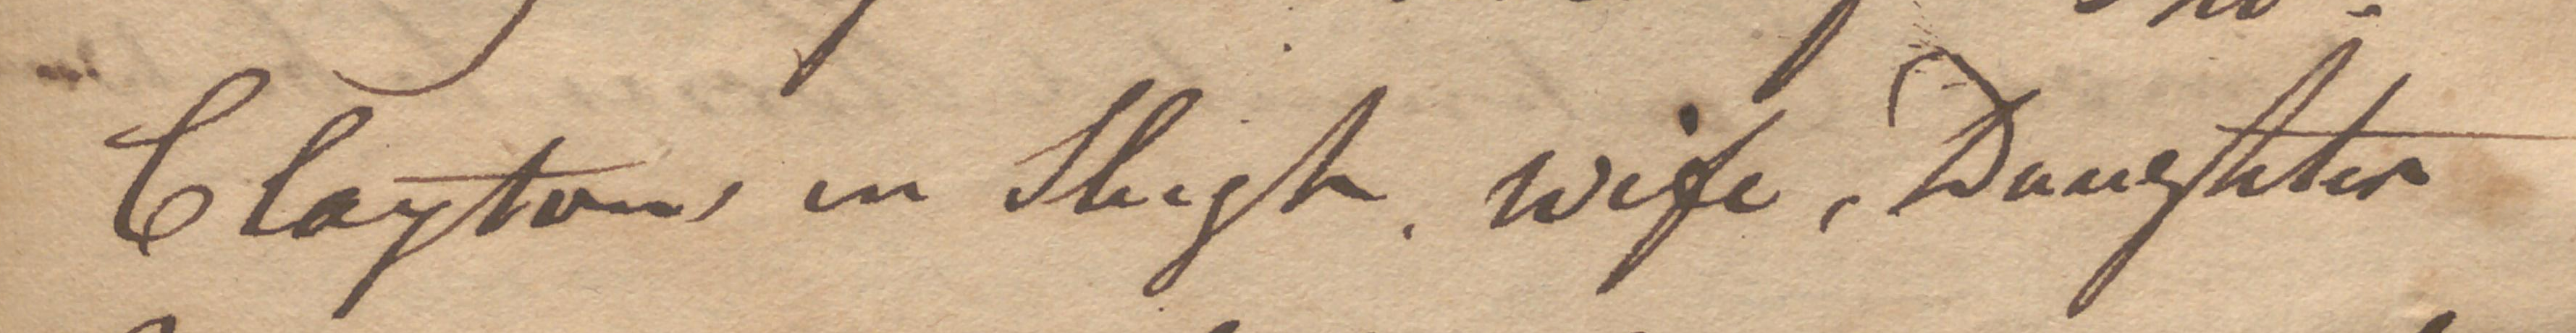Claytons in Sleigh. wife, Daughter
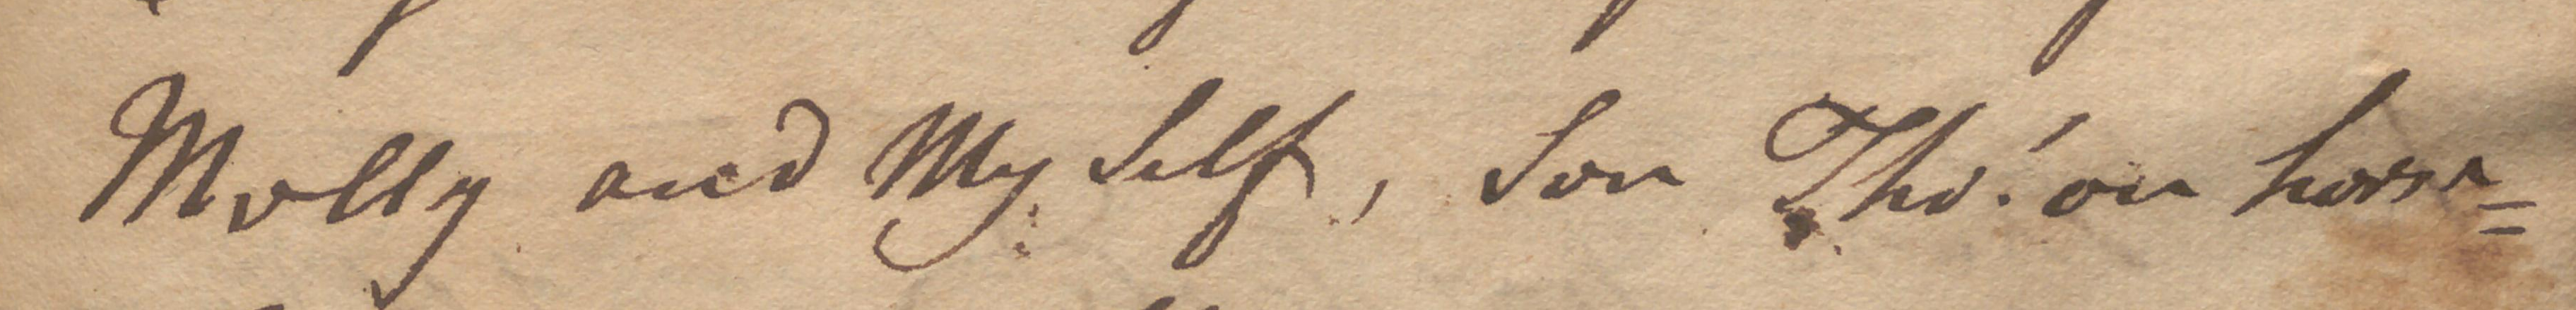Molly and My self, Son Tho^s. on horse-
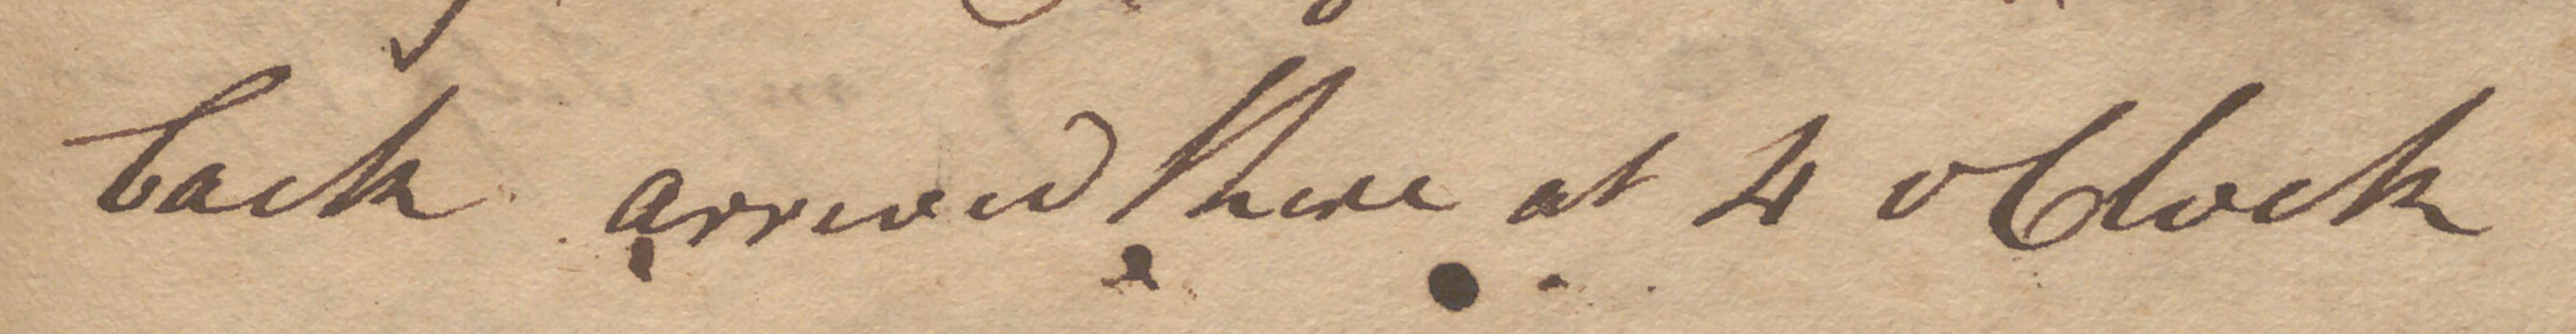back arrived there at 4 oClock
